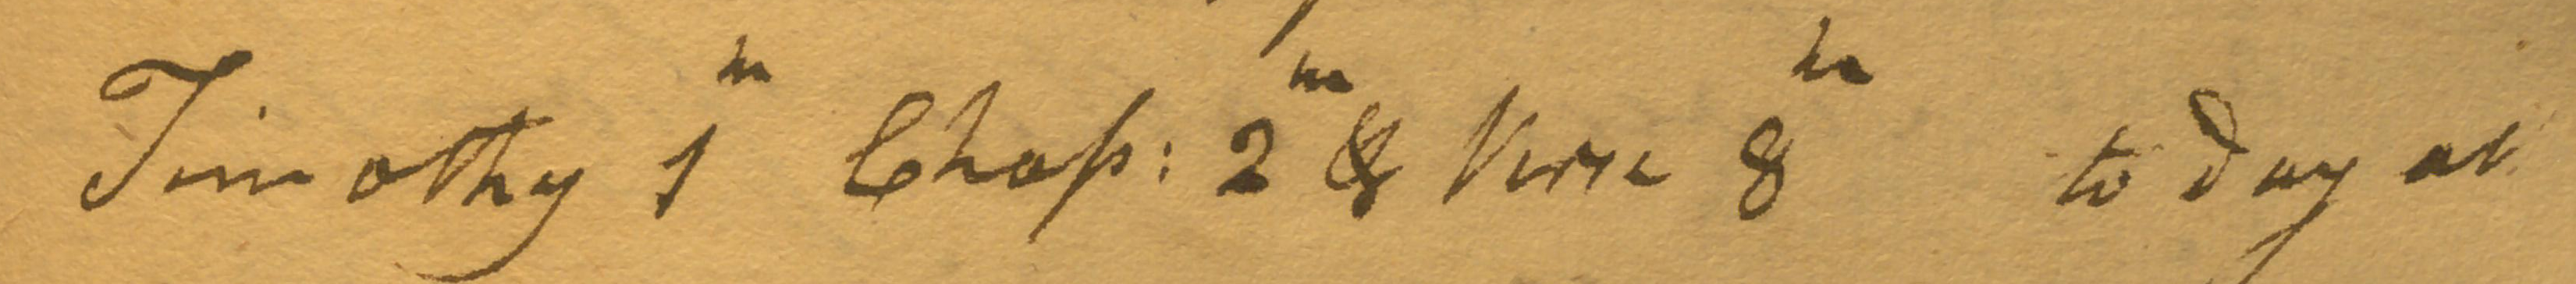Timothy 1^th Chap: 2^th Verse 8^th to day at
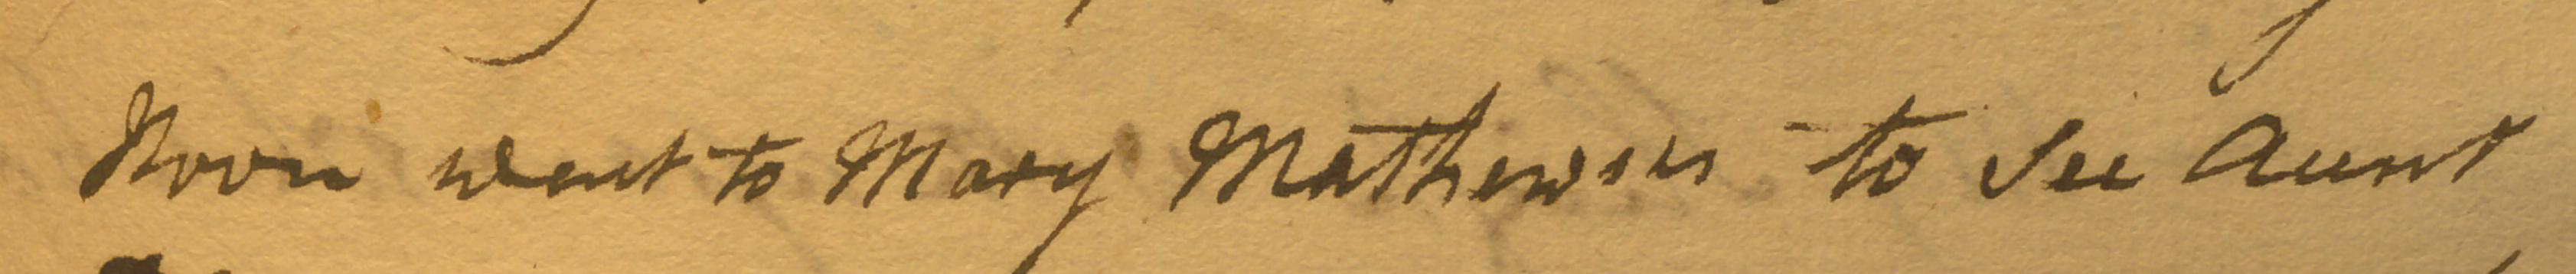noon went to Mary Mathewses to see Aunt
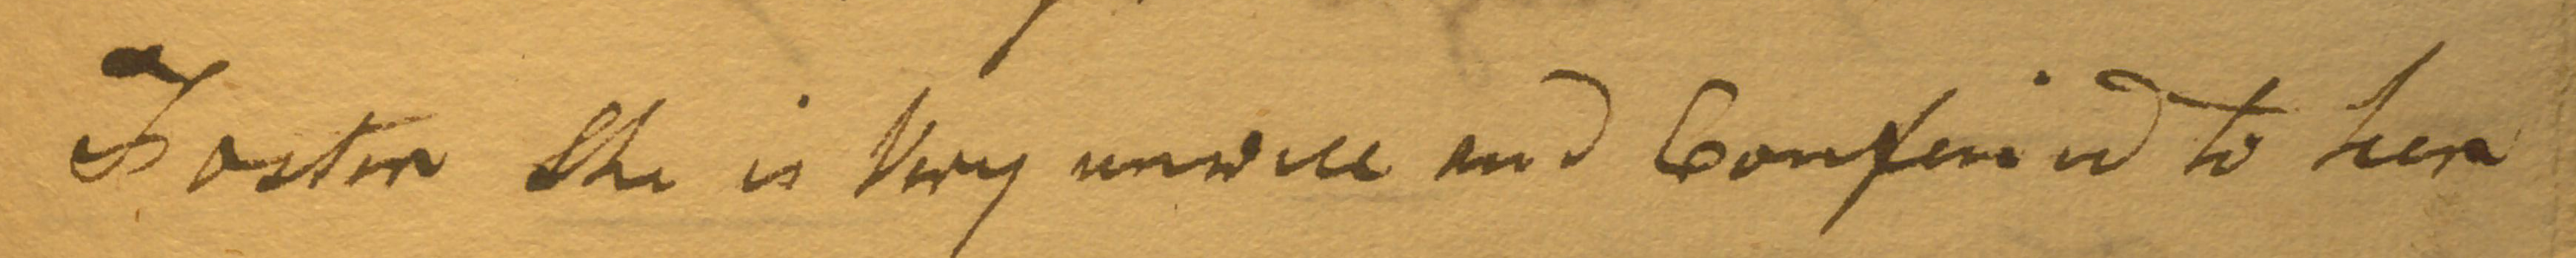Foster she is Very unwill and Confined to her
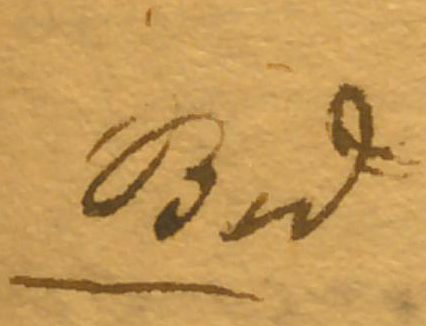Bed
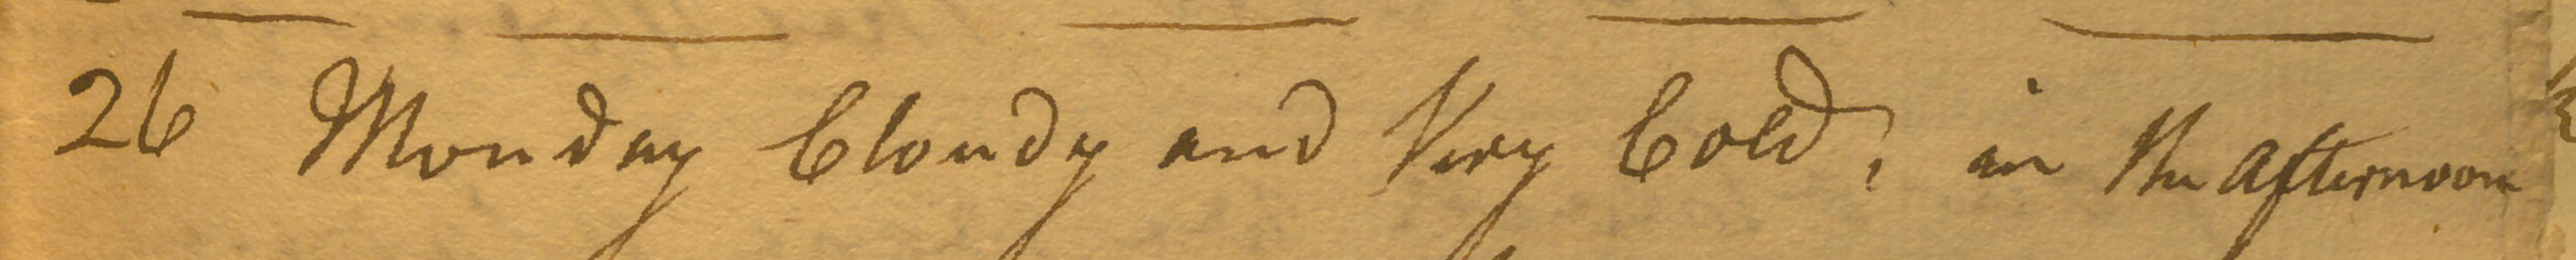26 Monday Cloudy and Very Cold, in the Afternoon
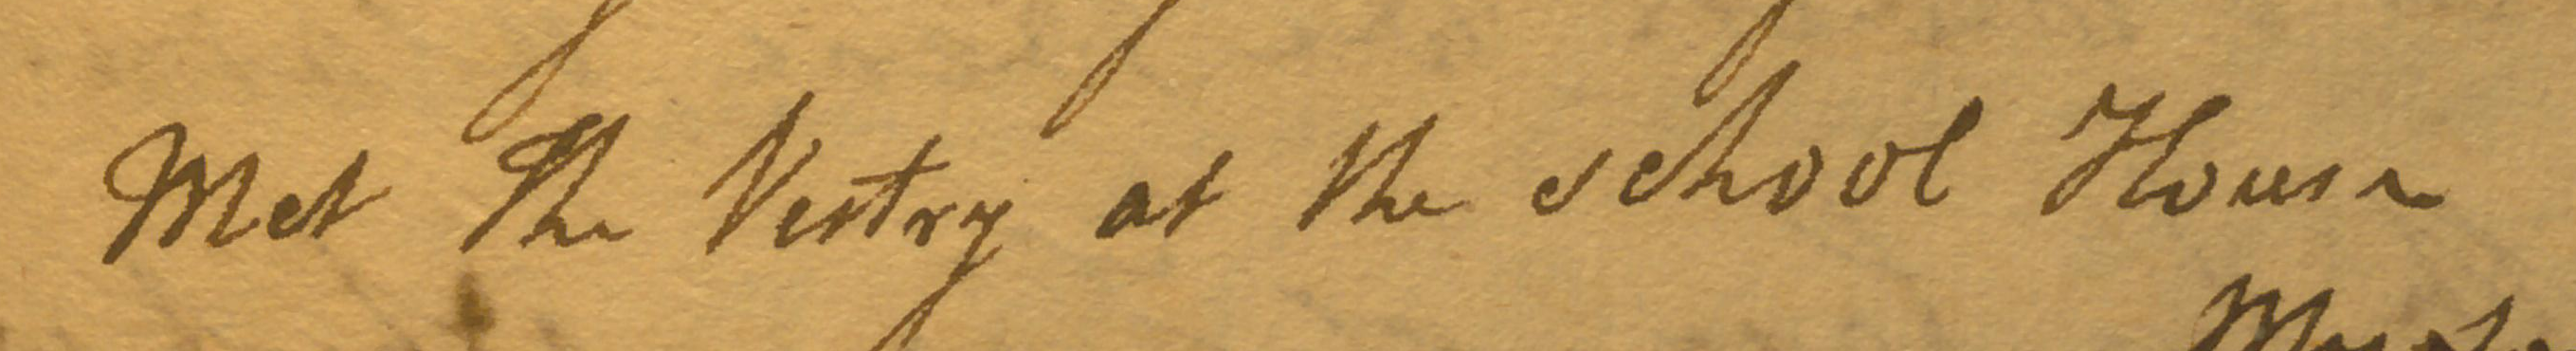Met The Vestry at the school House
